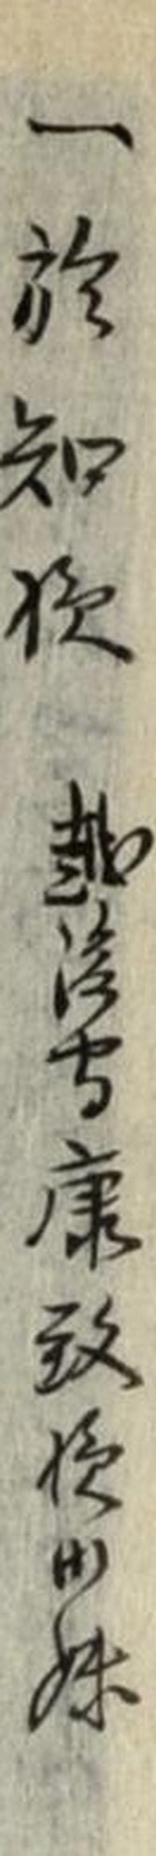一於知様越後守康致様御妹
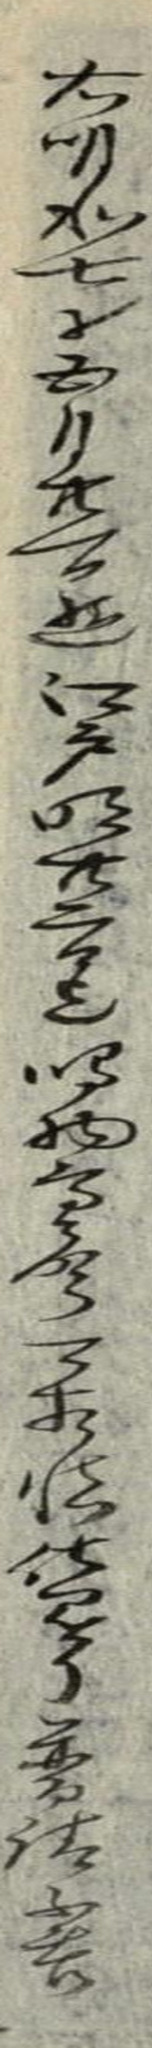右明和七刁五月廿一日逝江戸明廿二日迄鳴物高声可相慎仕懸り普請不苦
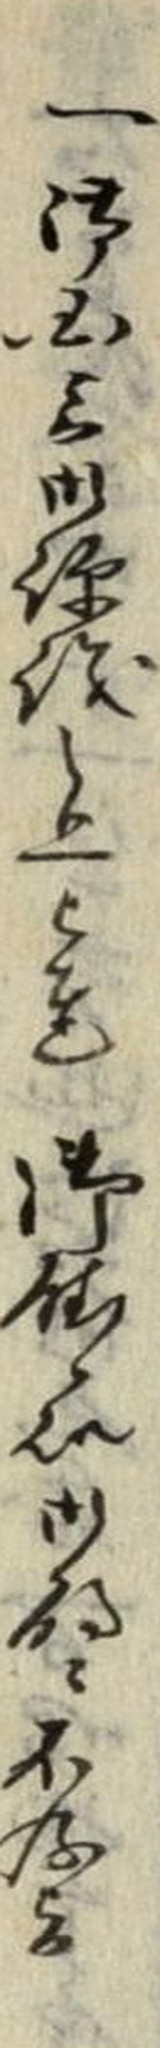一御国にて御評議之上被達御聴候処御触に不及旨
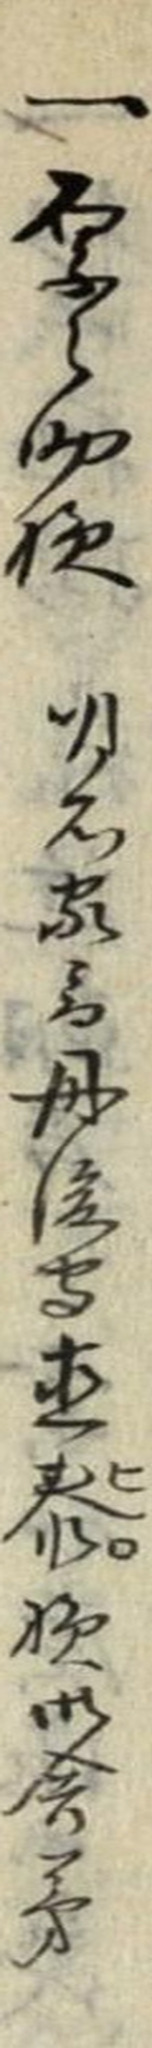一厚之助様明石家にて丹後守直泰様御舎弟
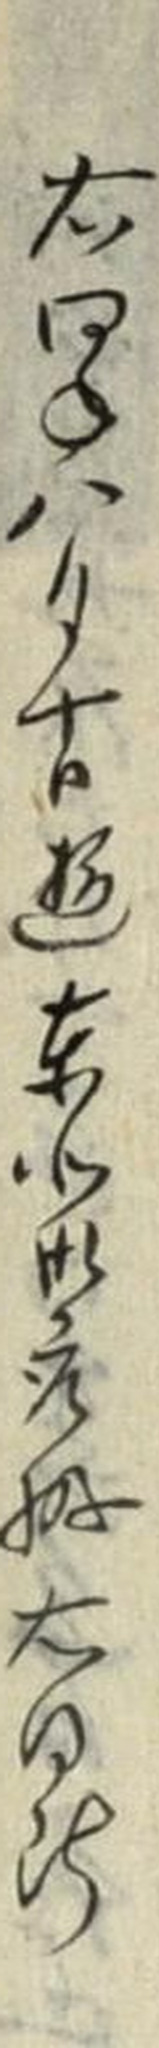右同年八月十日逝東北御取扱右同断
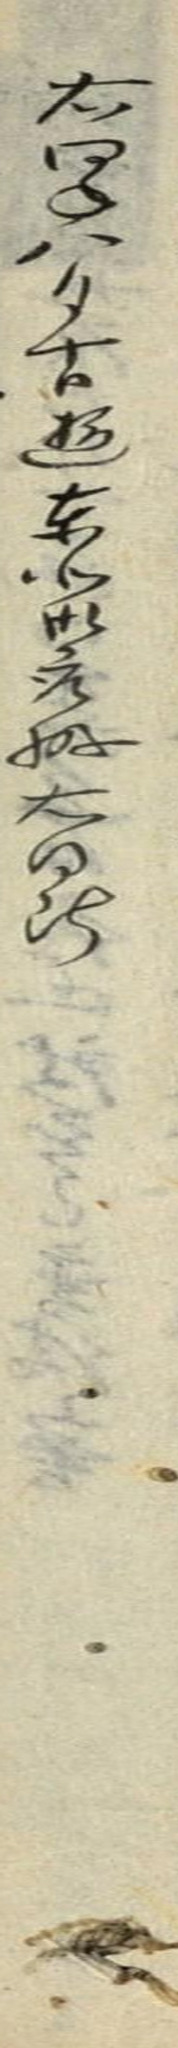右同年八月十日逝東北御取扱右同断
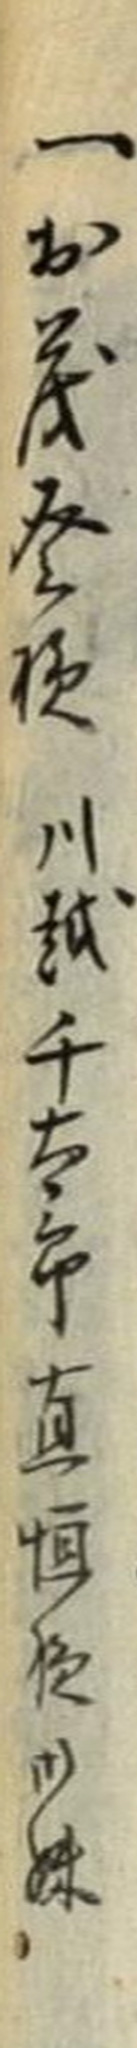一お茂登様川越千太郎直恒様御妹
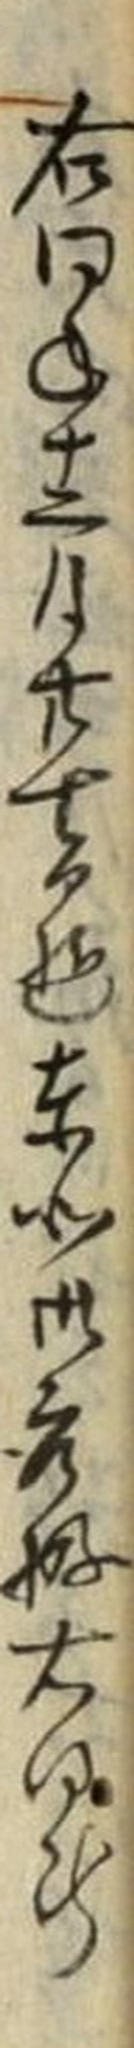右同年十二月廿七日逝東北御取扱右同断
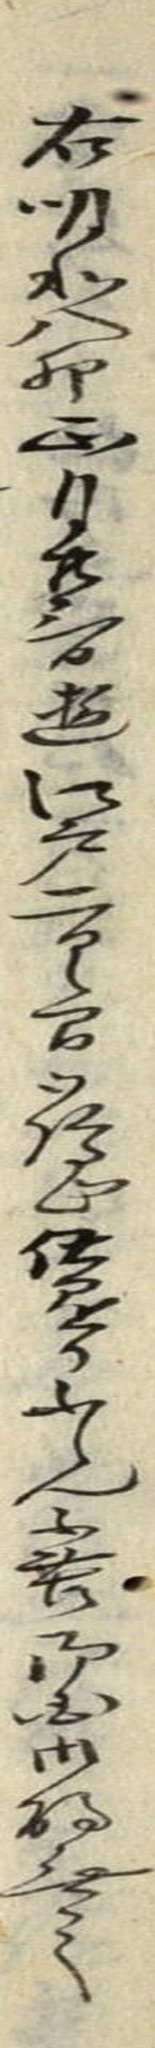右明和八卯正月廿三日逝江戸二日之間御停止仕懸りふしん不苦御国御触無之
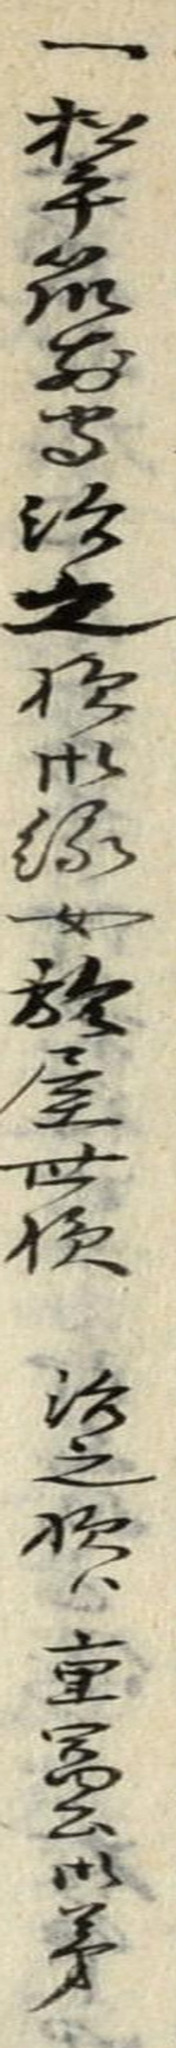一松平筑前守治之様御縁女於屋世様治之様は重富公御弟
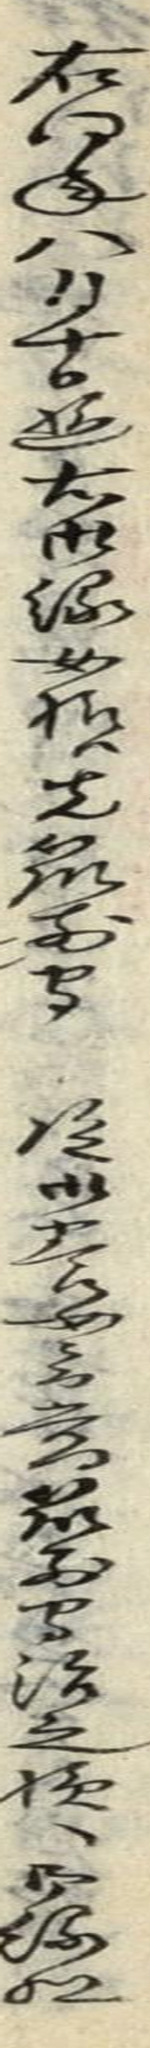右同年八月十日逝右御縁女様は先筑前守殿御養女にて当筑前守治之様へ御縁組
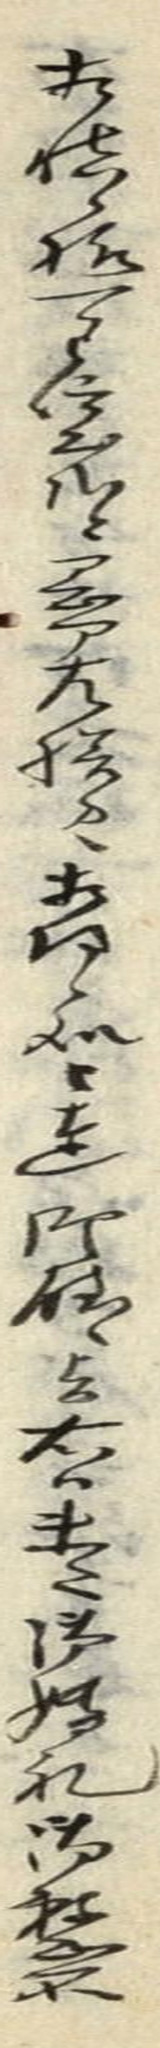相慎候様可被仰出哉と岡部左膳方へ相伺候処被達御聴候旨右は未た御婚礼御整不
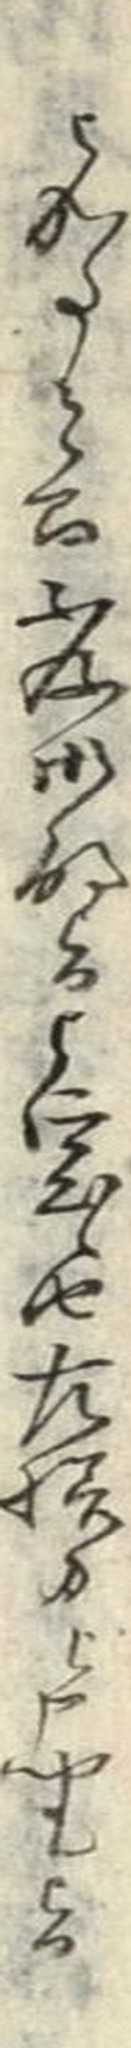被成事に候間不及御触旨被仰出候由左膳方被申聞候旨
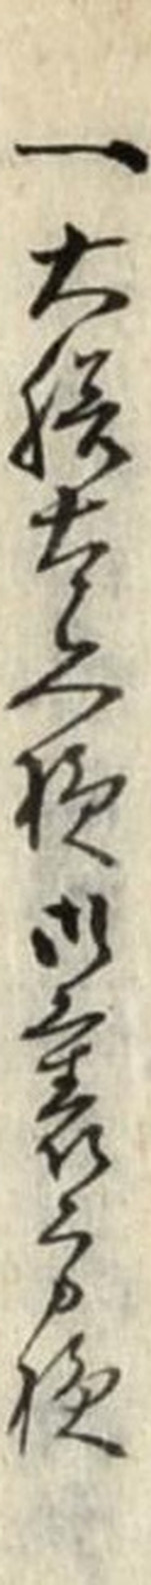一大膳大夫様御裏方様
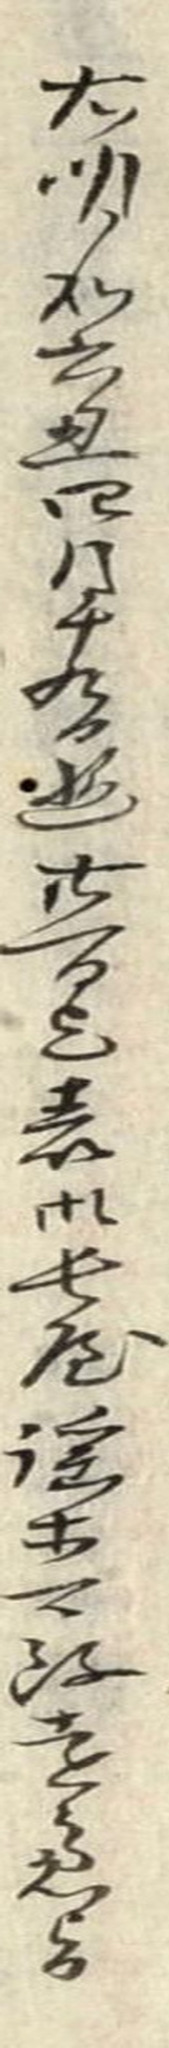右明和六丑四月十九日逝廿一日迄表御長屋謡等可致遠慮旨
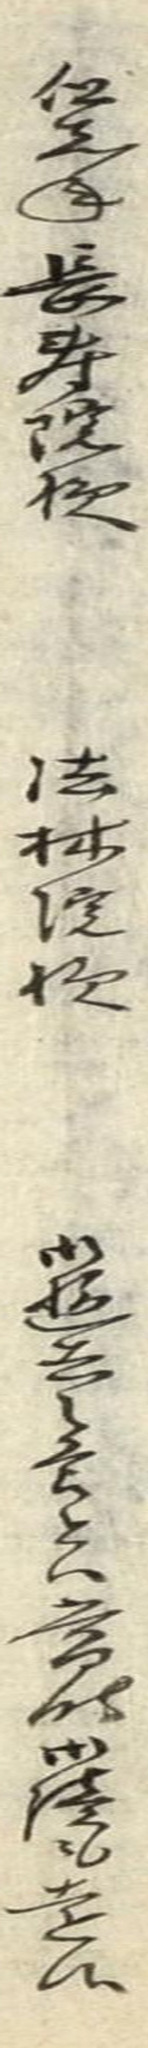但先年長寿院様法林院様御逝去之節とは当時御続も遠候
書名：御停止異変死失
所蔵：福井県文書館 Fukui Prefectural Archives
